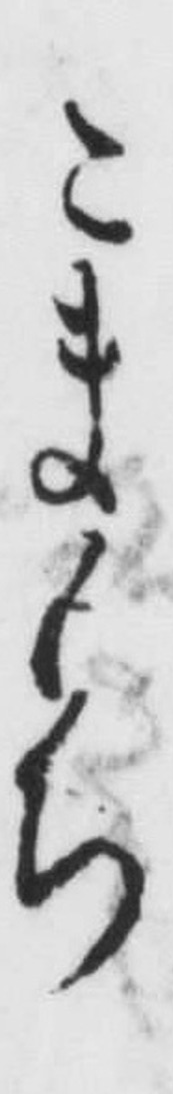ごまもち
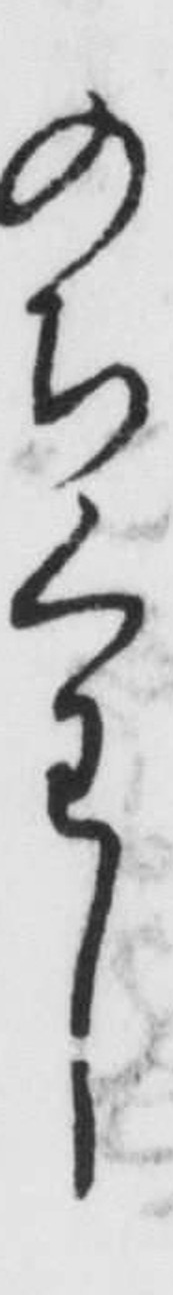のちくわし

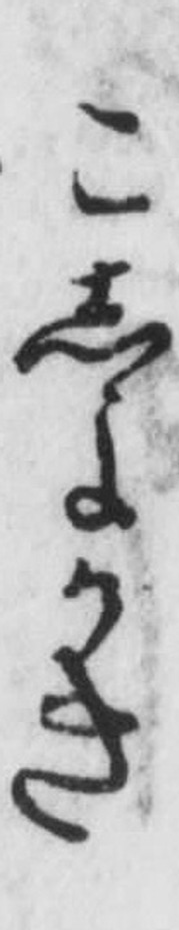ごしよかき
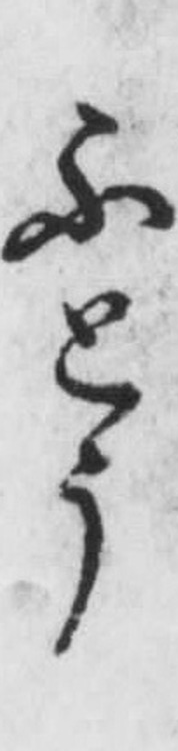ぶとう
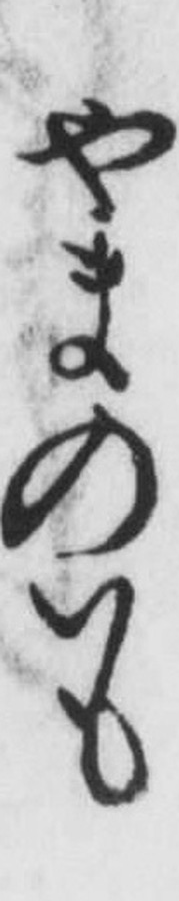やまのいも
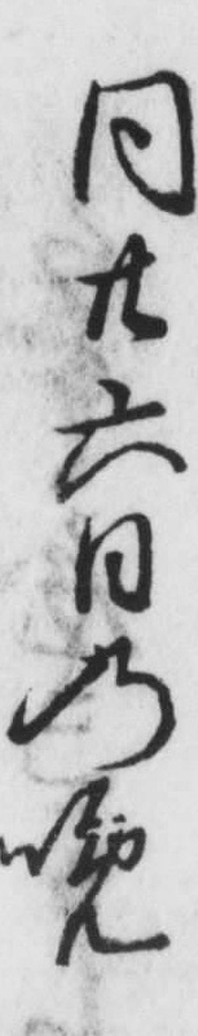同廿六日乃晩
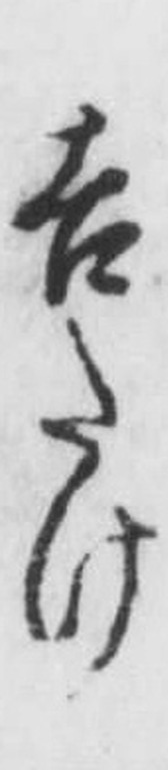枩たけ
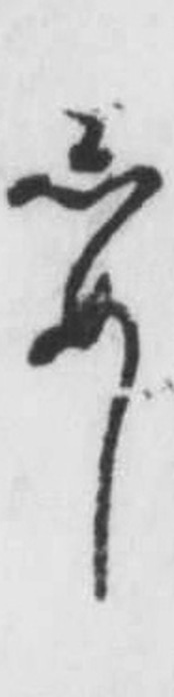しめじ
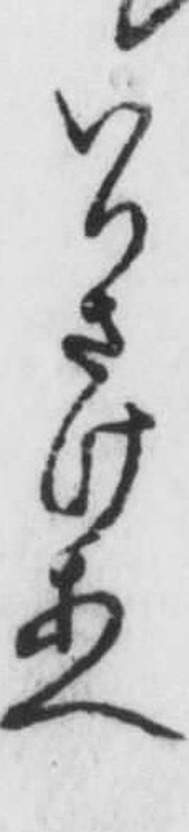いりさけあへ
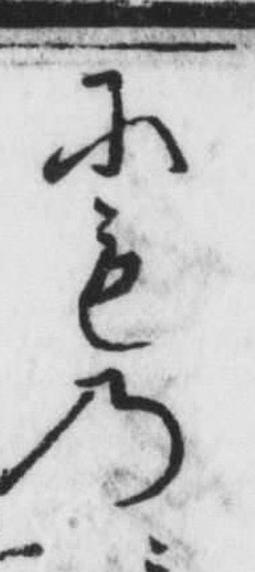ひもの
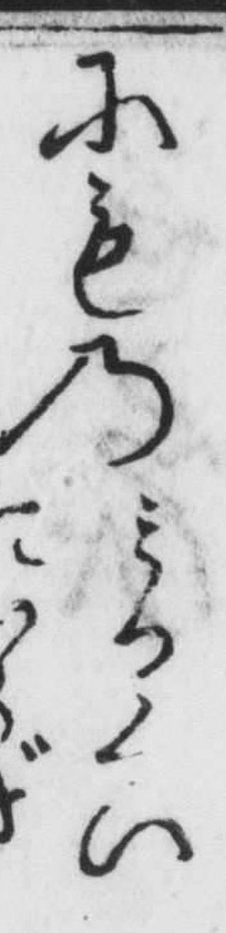にものミるくい
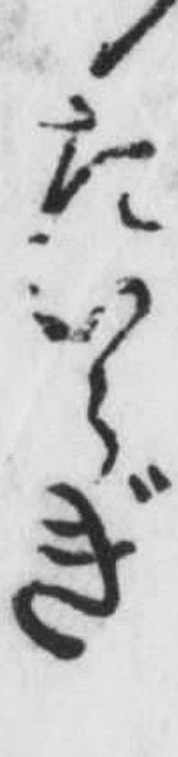たいらき
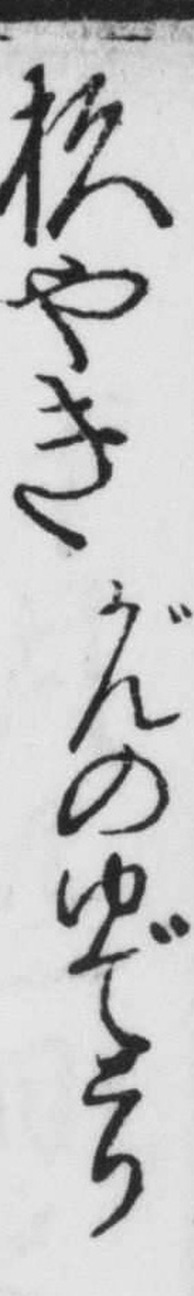杦やきがんのゆでどり
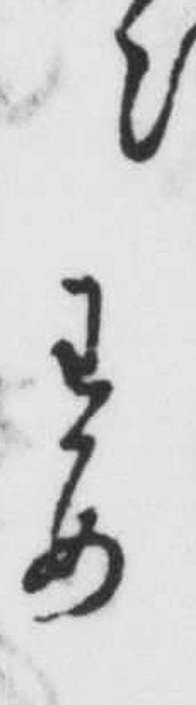わかめ
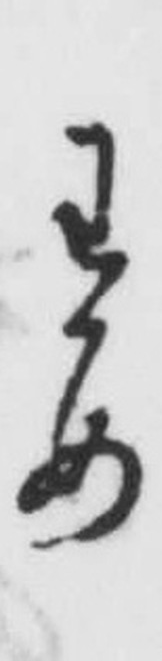わかめ
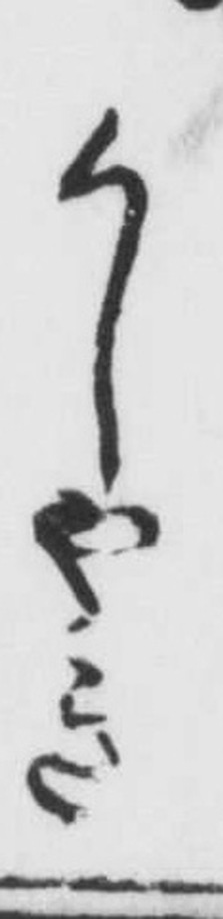くしやき
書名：料理切形秘伝抄
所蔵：大阪府立大学学術情報センター 国文学研究資料館
